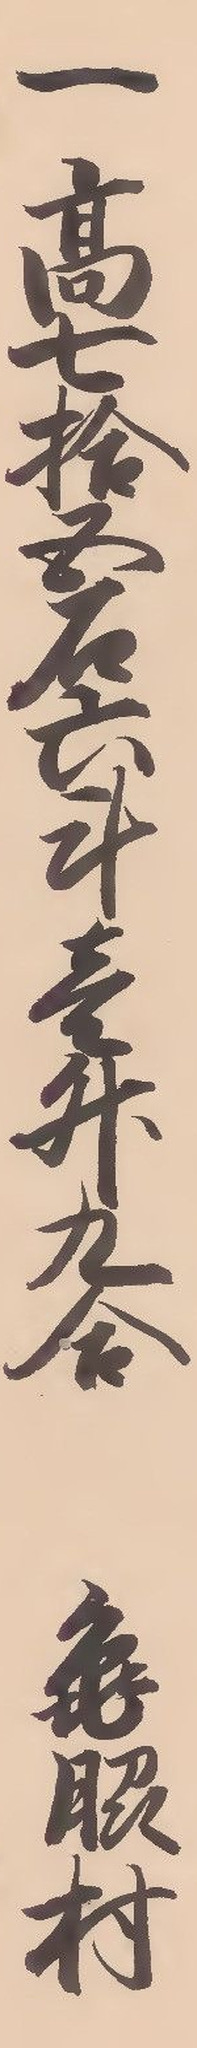一高七拾五石六斗壱升九合亀脇村

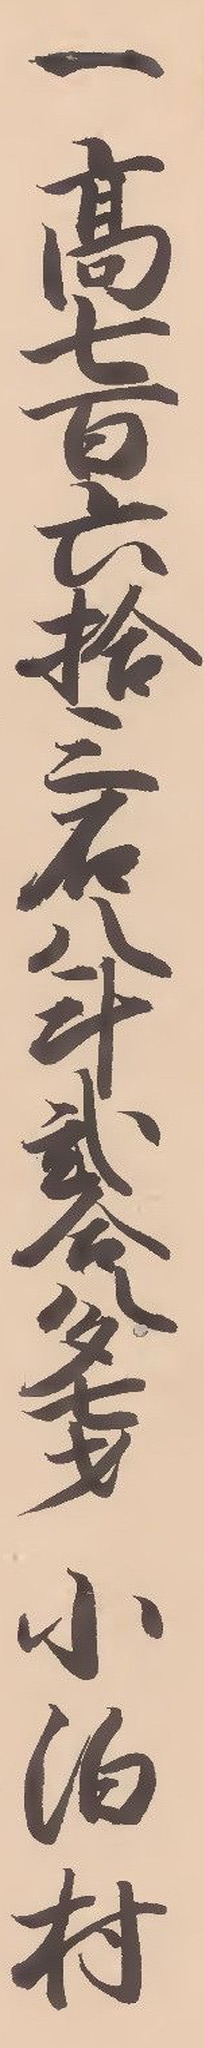一高七百六拾三石八斗弐合八勺七才小泊村
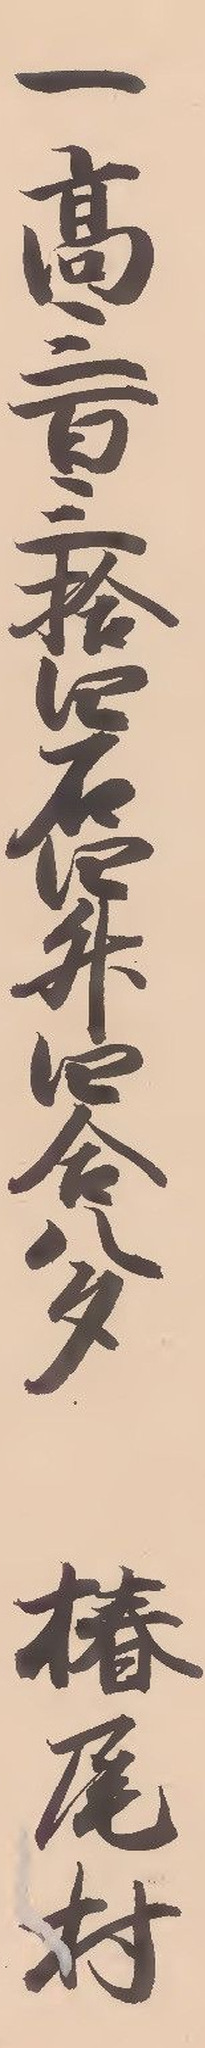一高三百三拾四石四升四合八勺椿尾村
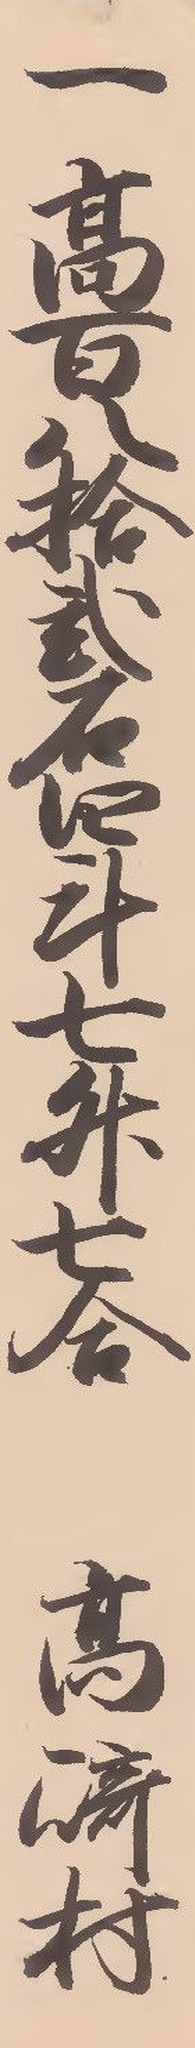一高百八拾弐石四斗七升七合高崎村
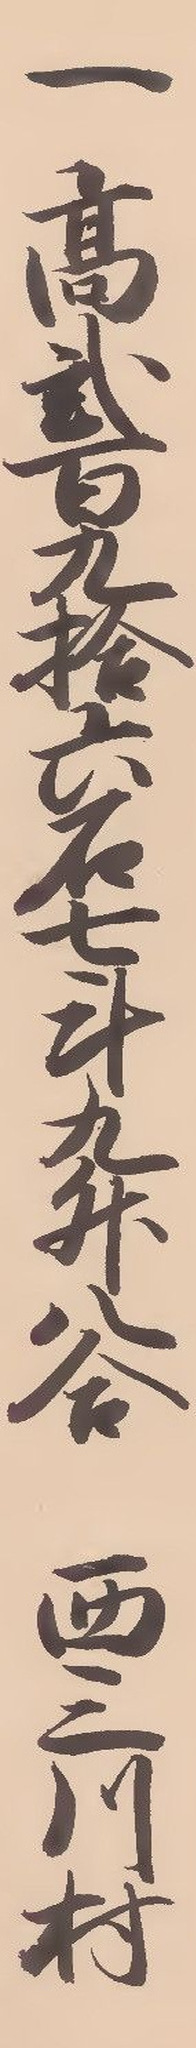一高弐百九拾六石七斗九升八合西三川村
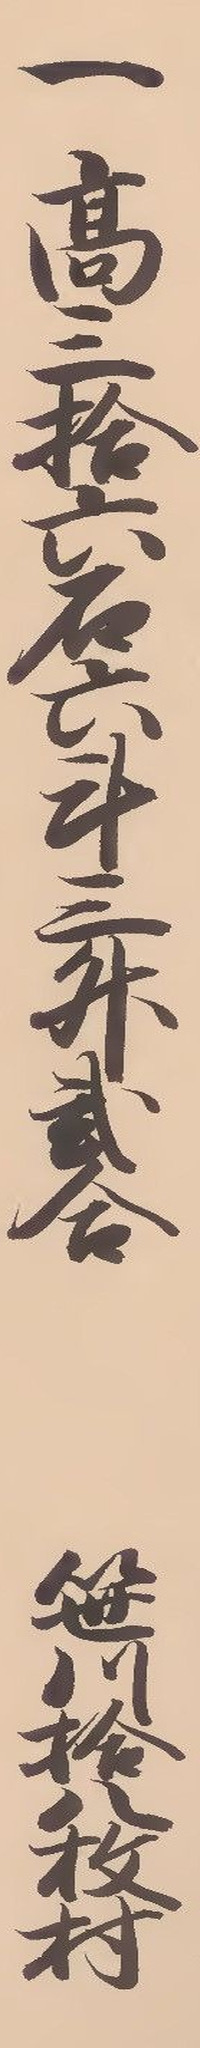一高三拾六石六斗三升弐合笹川拾八枚村
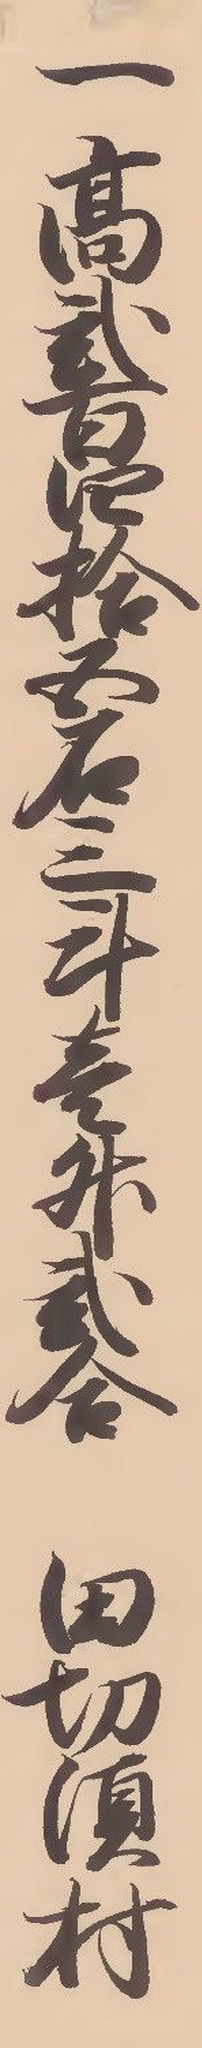一高弐百四拾五石三斗壱升弐合田切須村
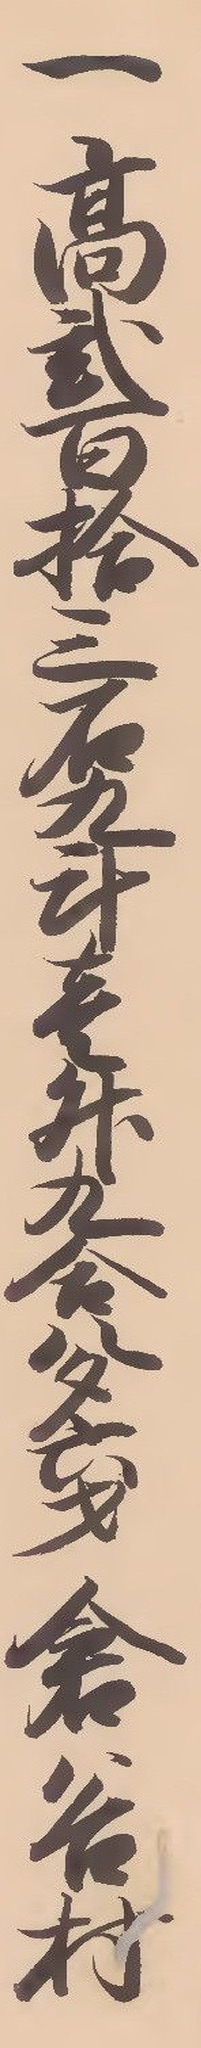一高弐百拾三石九斗壱升九合八勺六才倉谷村
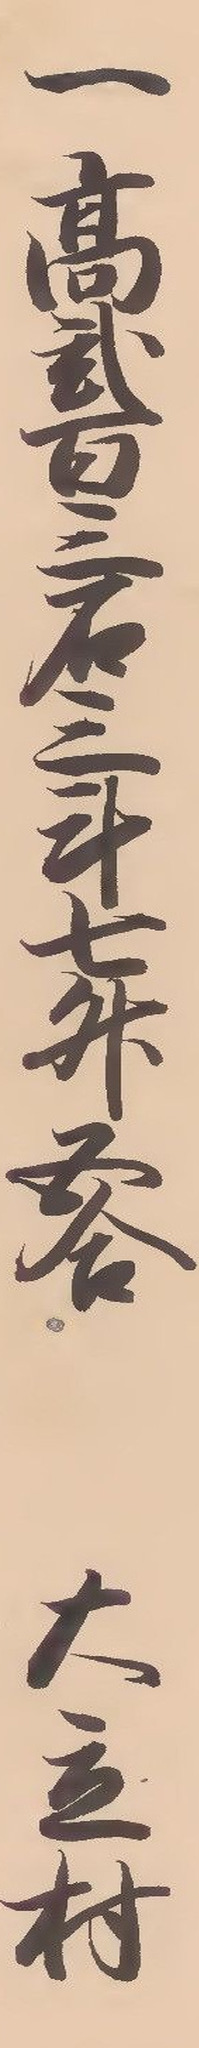一高弐百三石三斗七升五合大立村

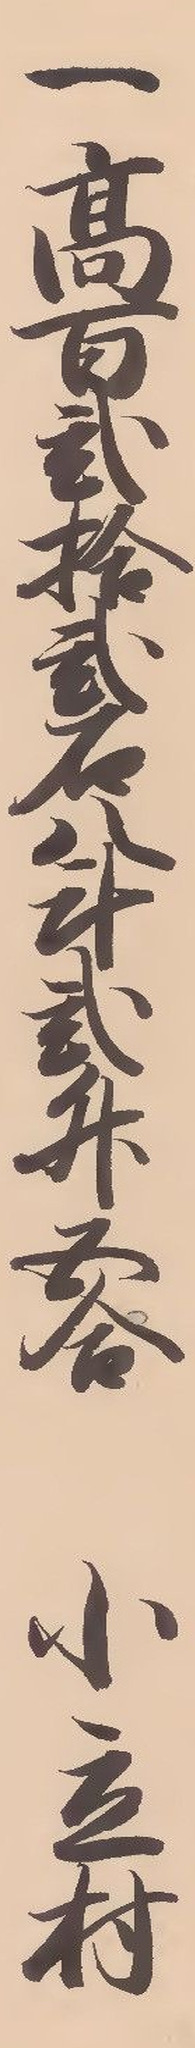一高百弐拾弐石八斗弐升五合小立村
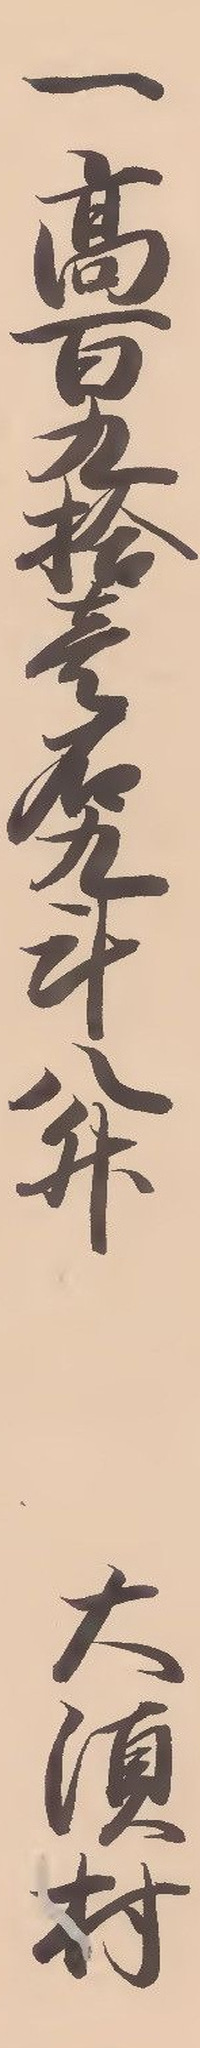一高百九拾壱石九斗八升大須村
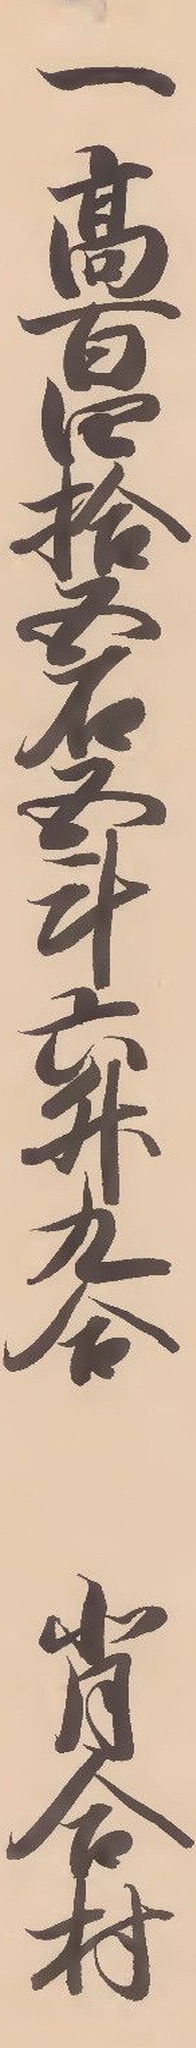一高百四拾五石五斗六升九合背合村
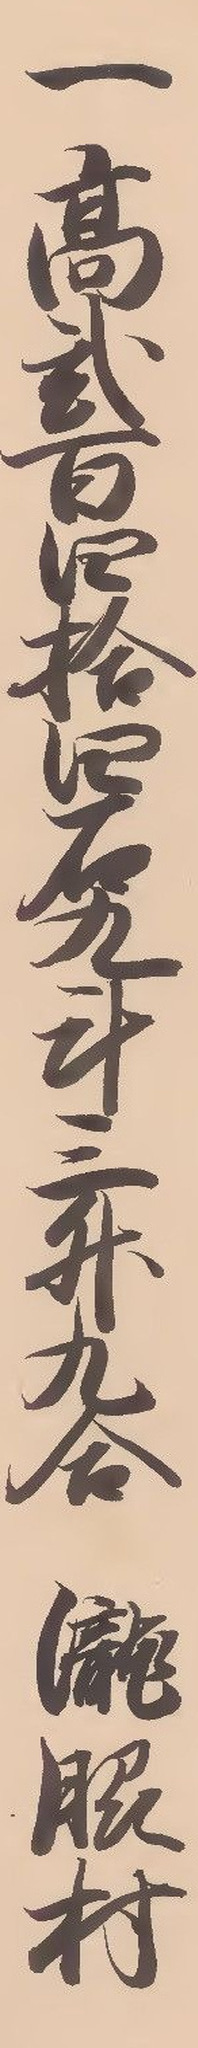一高弐百四拾四石九斗三升九合滝脇村
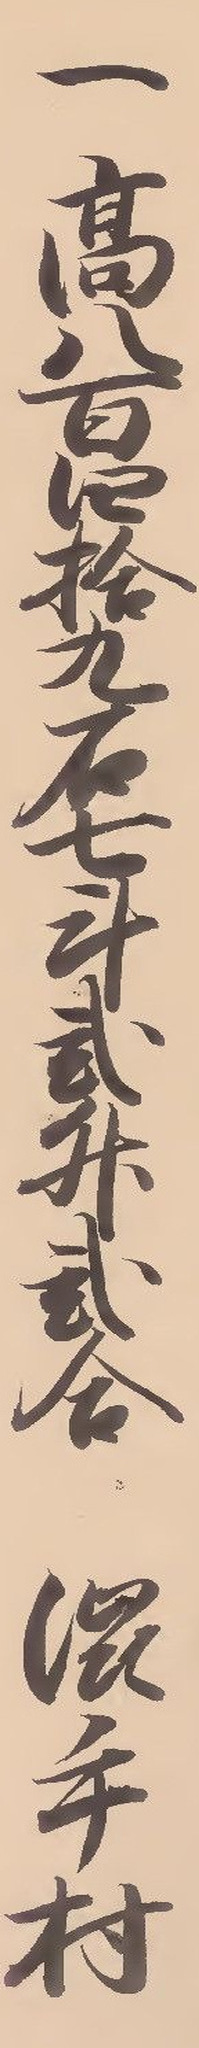一高八百四拾九石七斗弐升弐合渋手村
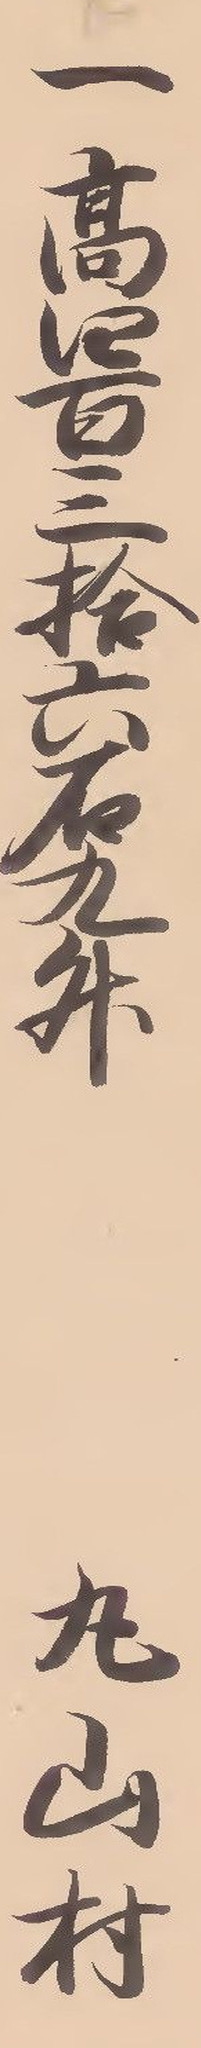一高四百三拾六石九升丸山村
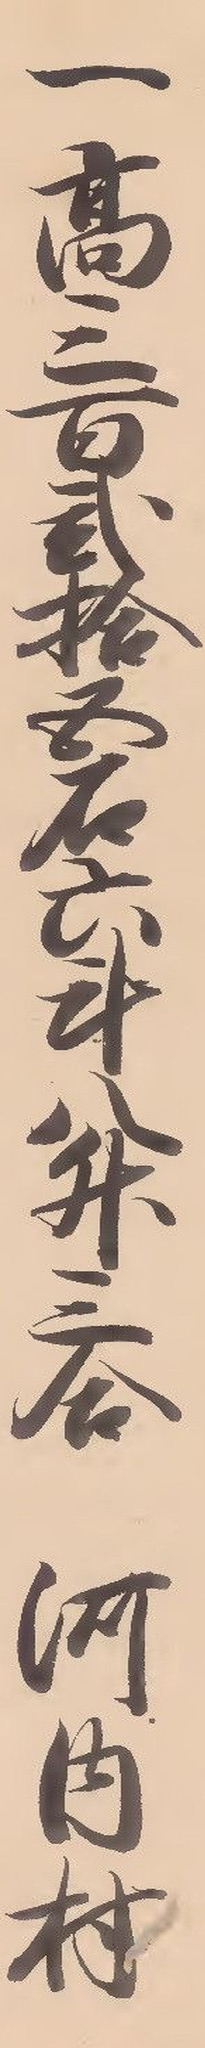一高三百弐拾五石六斗八升三合河内村
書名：佐渡国郷帳
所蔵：国立公文書館 National Archives of Japan
